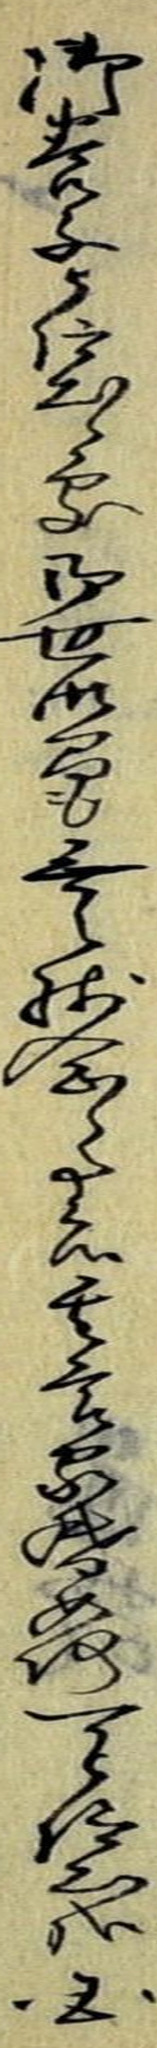御養子被仰出候処御世御間も無之残念之事ニ候其節家督如何可被仰出哉国
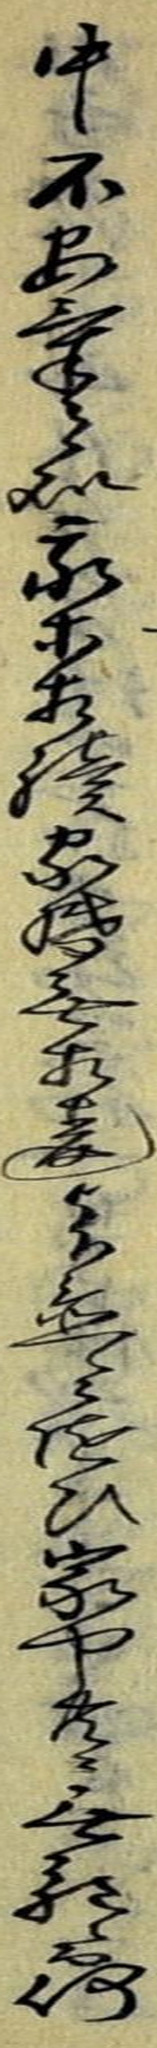中不安気ニ候処我等相続家督無相違被下置候ニ随ひ家中共ニ無難ニ而何
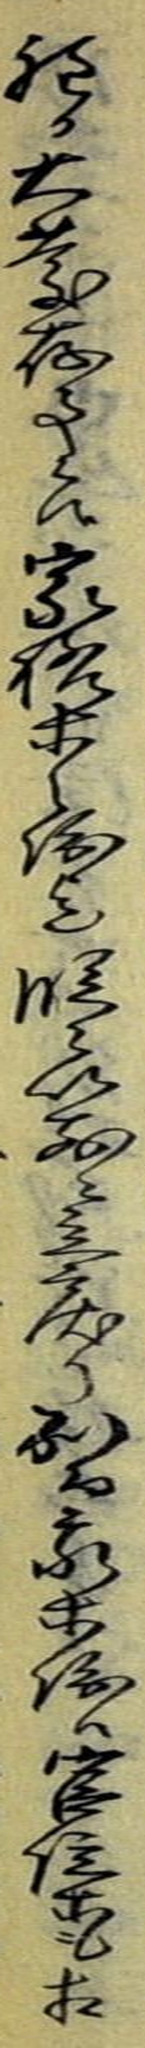程か大慶存事ニ候家格等之儀迄段々以前ニ立戻り別而我等儀ハ官位等も相
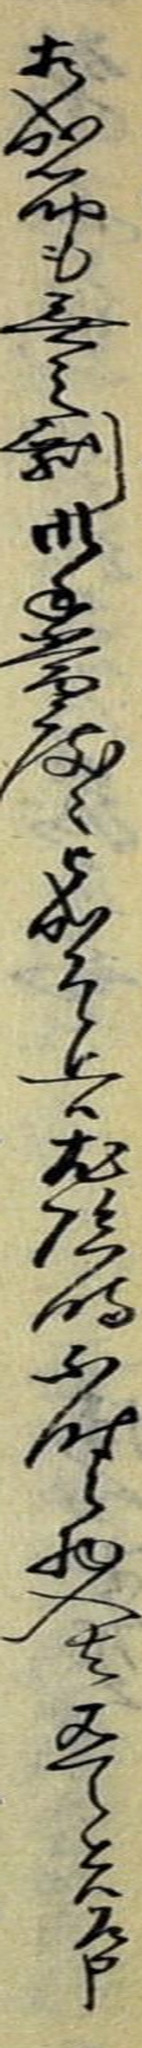相成筋も無之剰御手当度々被成下候上ハ尤臨時不時之物入者有之とハ乍申
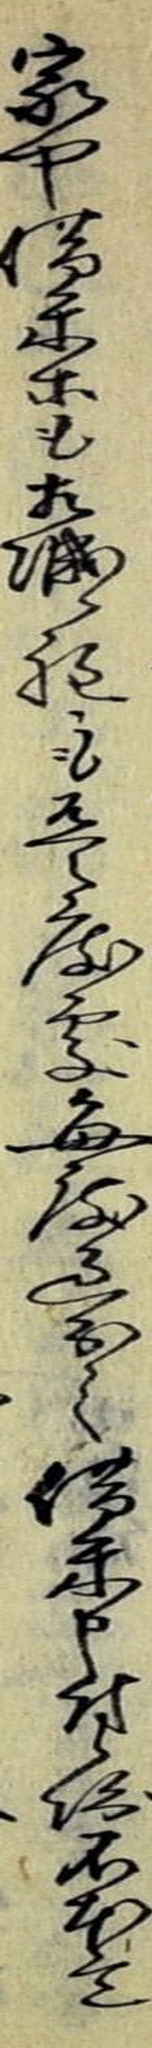家中借米等も相減候程ニも有之度処毎度過分之借米申付候儀不本意
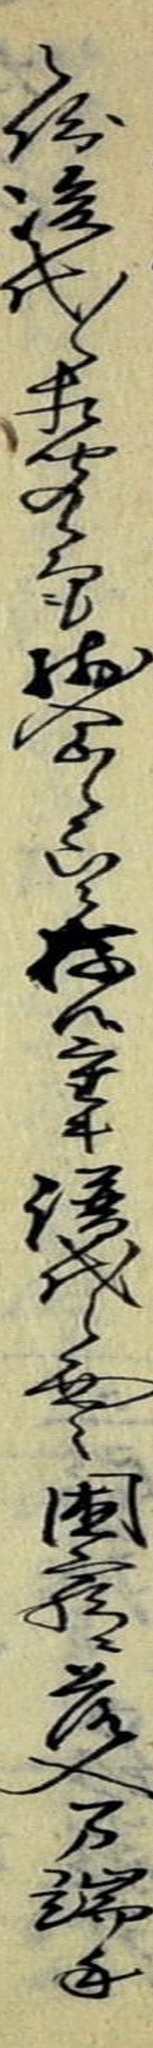之儀後代へ相聞候而も残念之至ニ存候重キ譜代之面々困窮ニ落入万端手
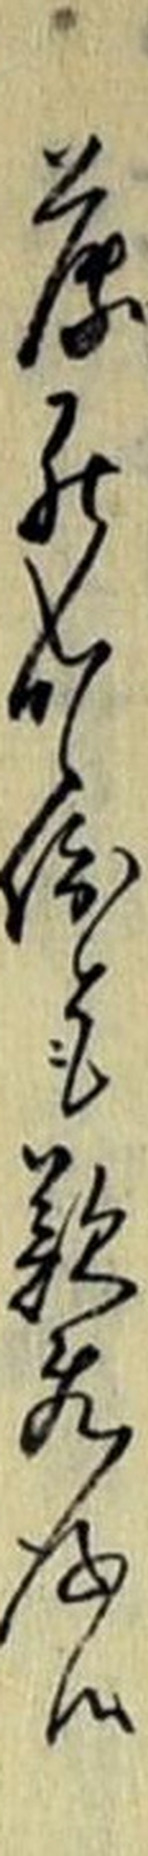薄罷成候儀とも歎敷存候

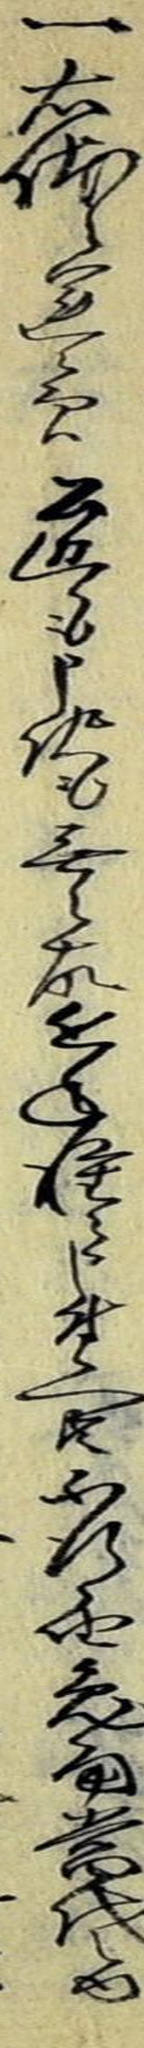一右体之運ニ而ハ公辺へも申訳も無之故近年種々申付候へ共不行届兎角当代之内
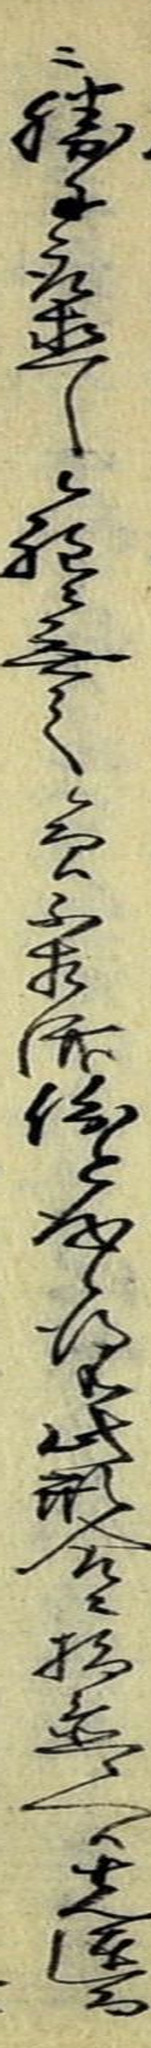ニ勝手取直し候程ニ無之候而ハ不相済儀と存候得共此形合ニ指置候ヘハ先達而
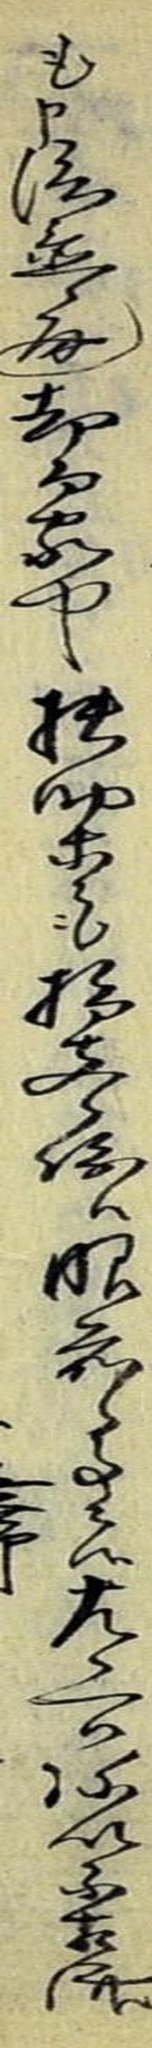も申渡置候通却而家中扶助等ニも指支候儀ハ眼前之事ニ候左候ヘハ弥以不相済
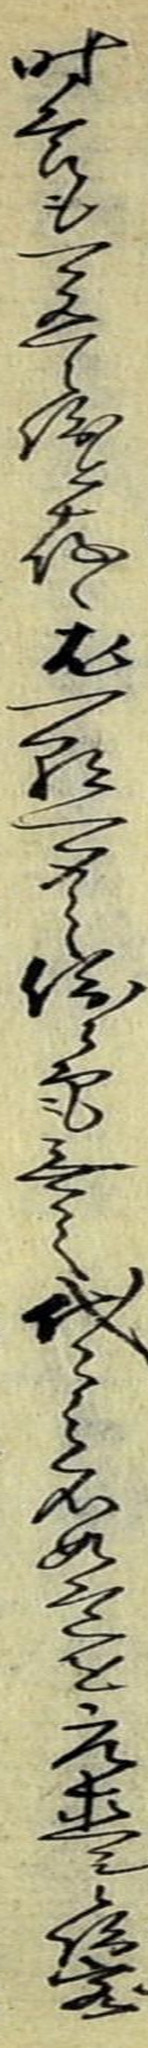時節も可有之儀と存候尤一朝一夕之儀ニ而も無之代々之不如意を取直シ候儀容
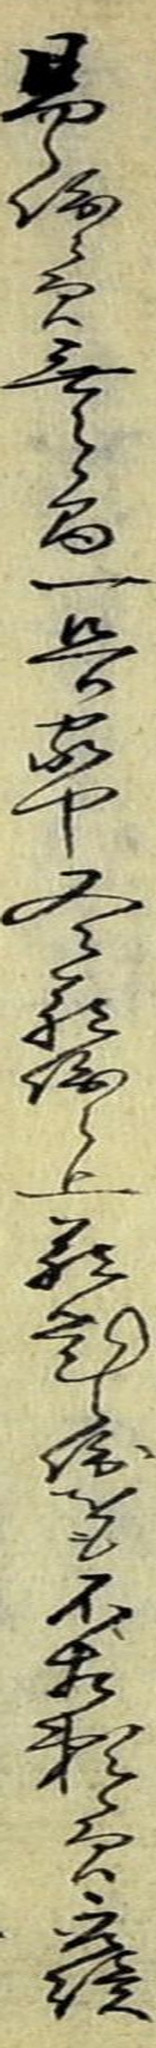易之儀ニ而ハ無之候間一旦ハ家中又々難儀之上難題之儀をも不相頼候而ハ取続
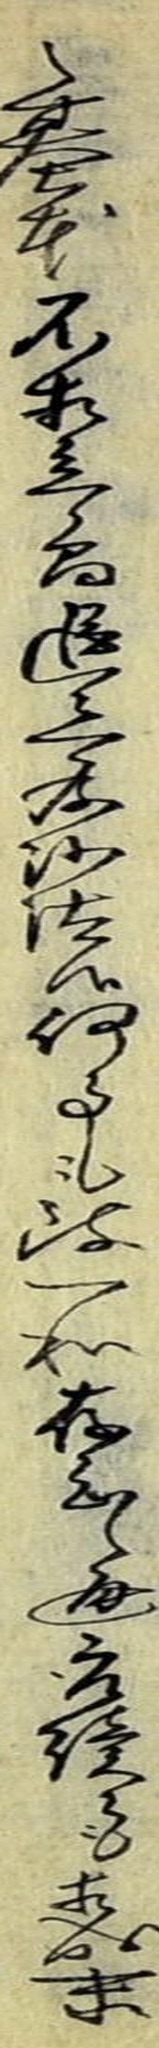之基本不相立候間追々可及沙汰候何事も致一和存念之通取続ニも相成末
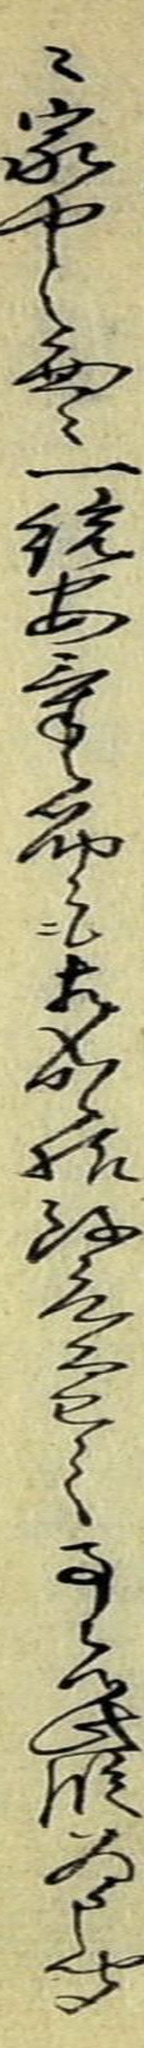々家中之面々一統安気之筋ニも相成候様致度而已之事ニ候此段為申聞
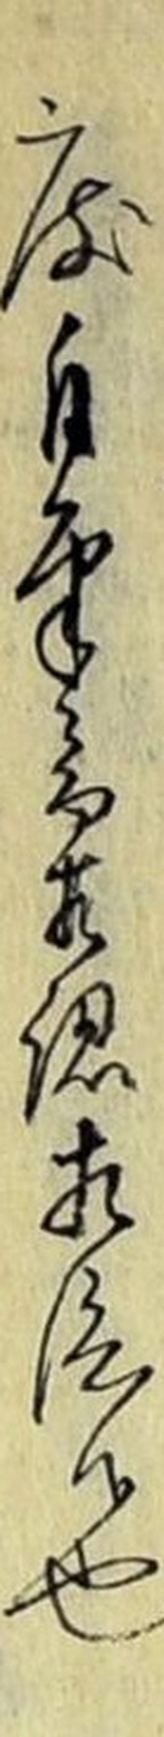度自筆ニ而相認相渡候也
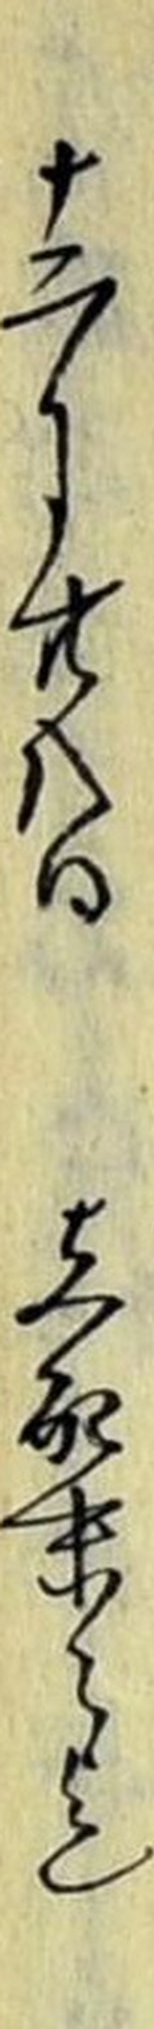十二月廿八日支配末々迄
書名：命令之部 三
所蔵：福井県文書館 Fukui Prefectural Archives
